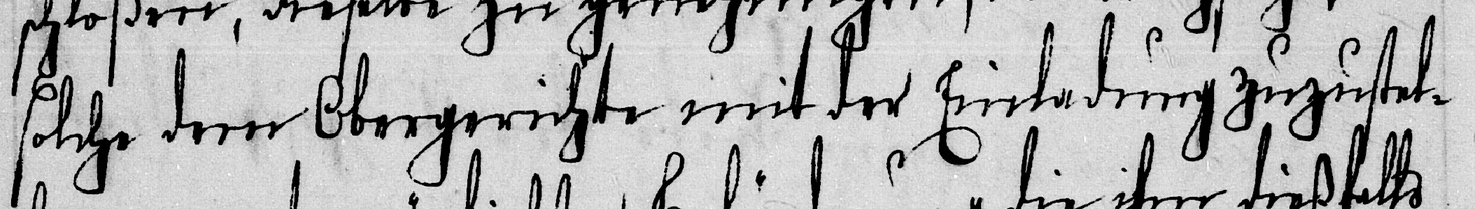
solche dem Obergerichte mit der Einladung zuzustel¬
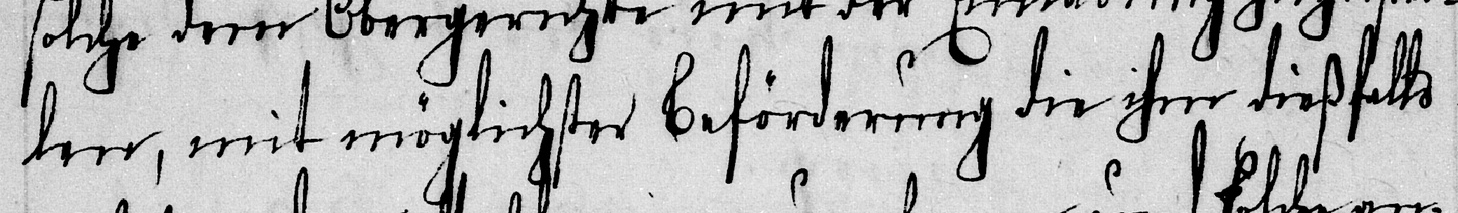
len, mit möglichster Beförderung die ihm dießfalls
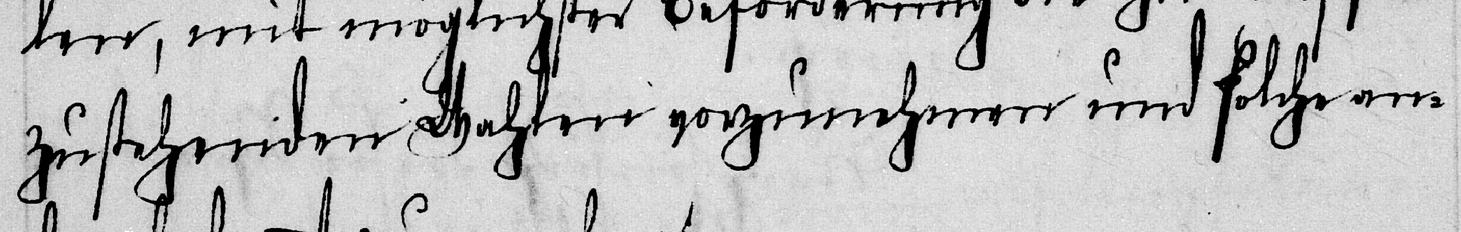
zustehenden Wahlen vorzunehmen und solche an¬
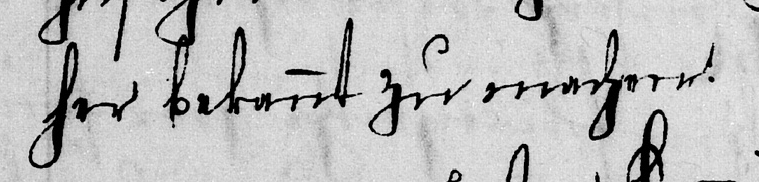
her bekannt zu machen.
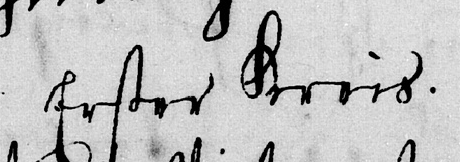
Erster Kreis.
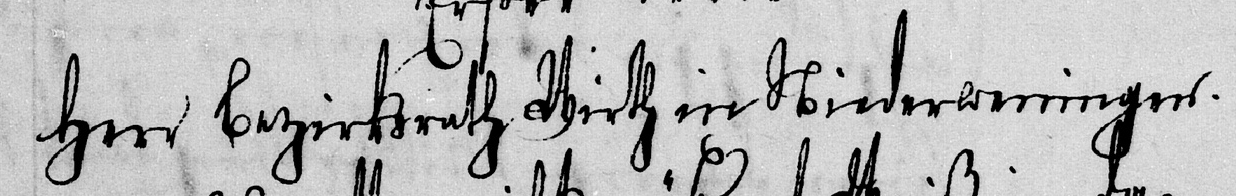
Herr Bezirksrath Wirth in Niederweningen.
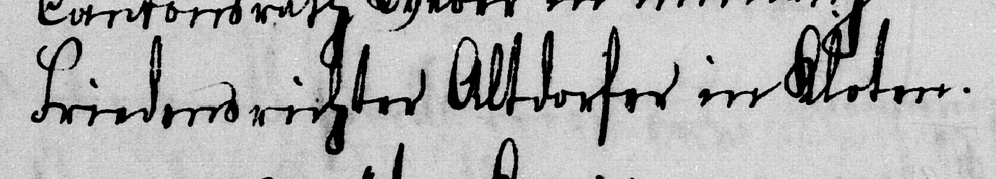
riedensrichter Altdorfer in Kloten.
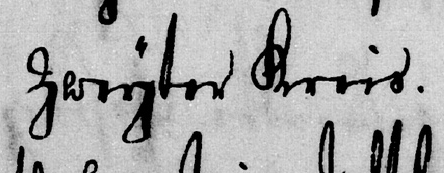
Zweyter Kreis.
